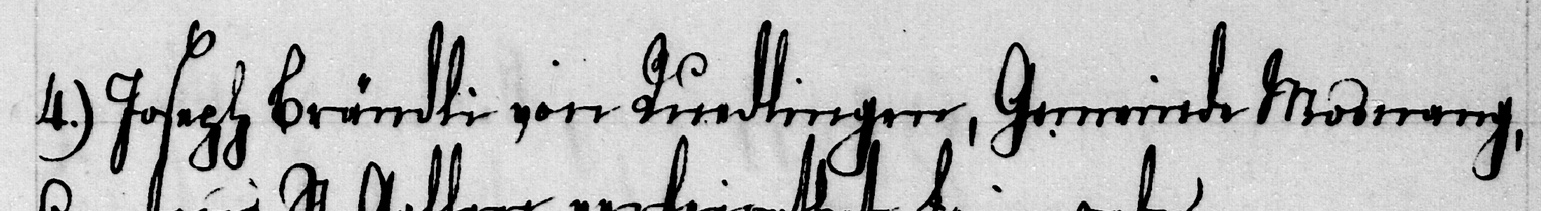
4.) Joseph Brändli von Ruedlingen, Gemeinde Mosnang,
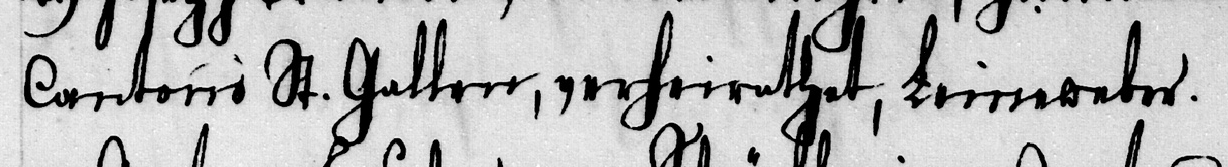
Cantons St. Gallen, verheirathet, Leineweber.
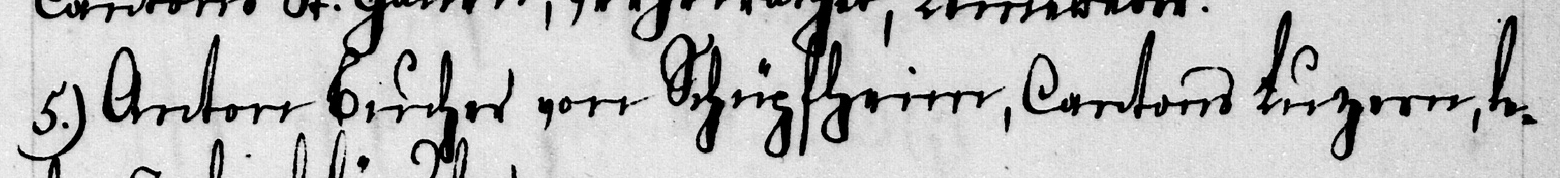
5.) Anton Bucher von Schüpfheim, Cantons Luzern, le¬
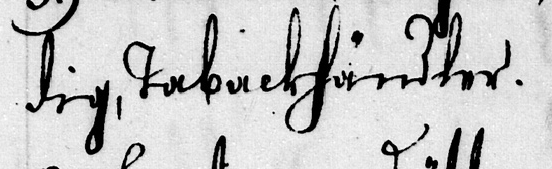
dig, Tabackhändler.
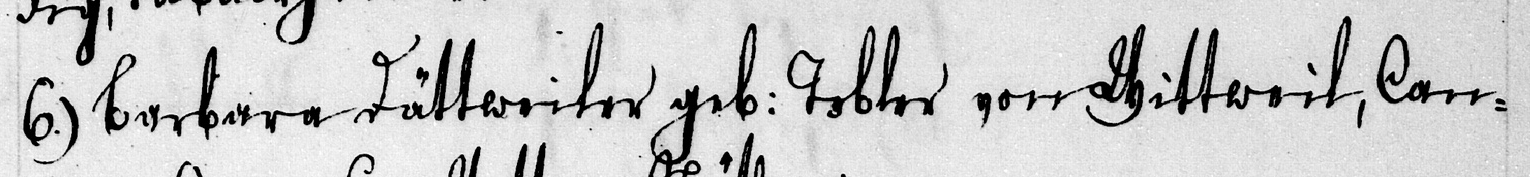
6.) Barbara Dättweiler geb: Tobler von Wittweil, Can¬
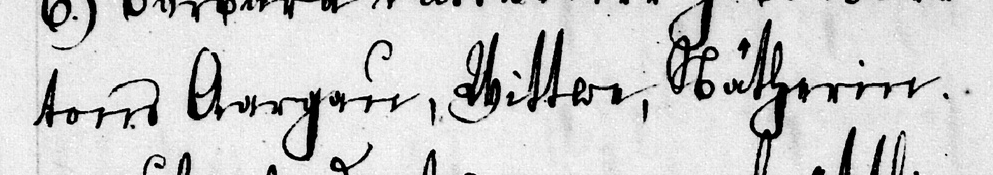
tons Aargau, Wittwe, Nätherin.
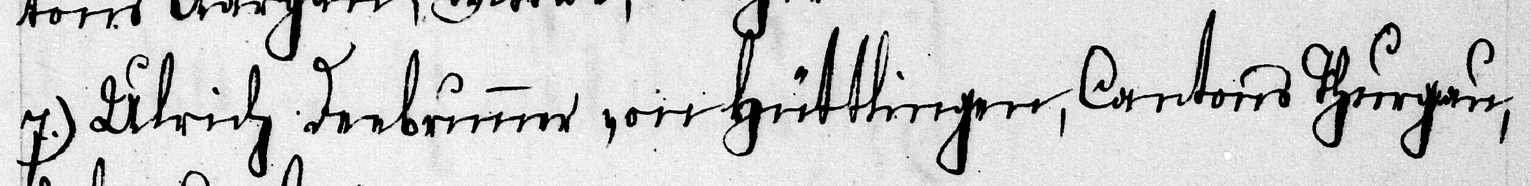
7.) Ulrich Deebrunner von Hüttlingen, Cantons Thurgau,
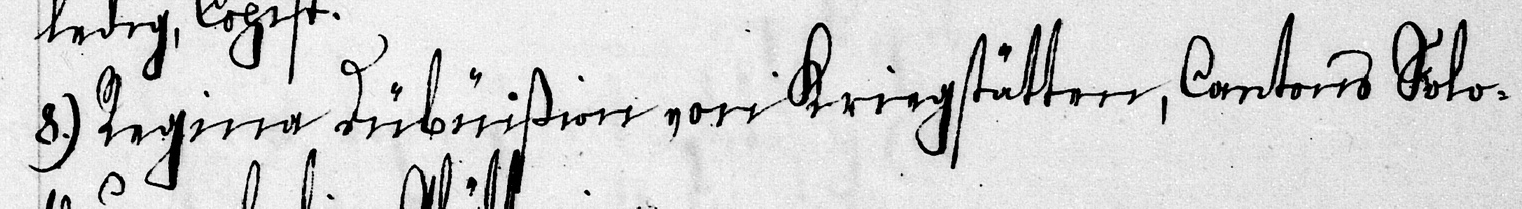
8.) Regina Dübüißion von Kriegstätten, Cantons Solo¬
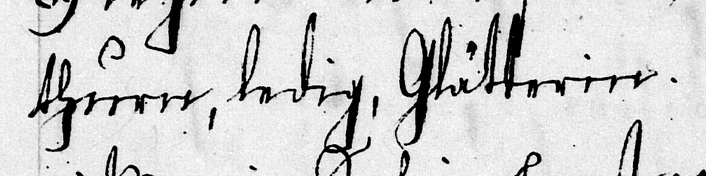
thurn, ledig, Glätterin.
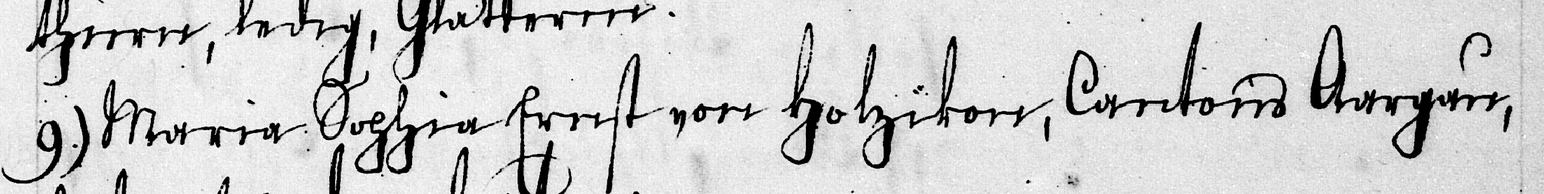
9.) Maria Sophia Ernst von Holzikon, Cantons Aargau,
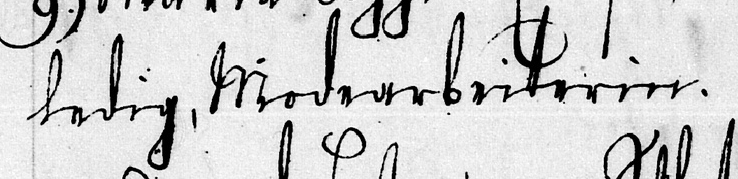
ledig, Modearbeiterin.
